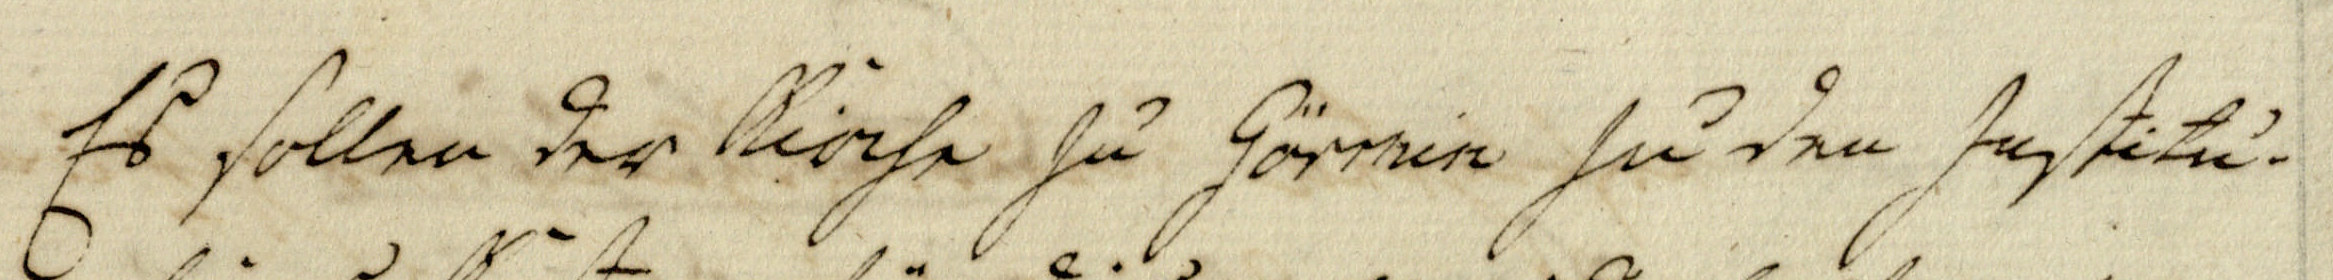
Es sollen der Kirche zu Görmin zu den Institu¬
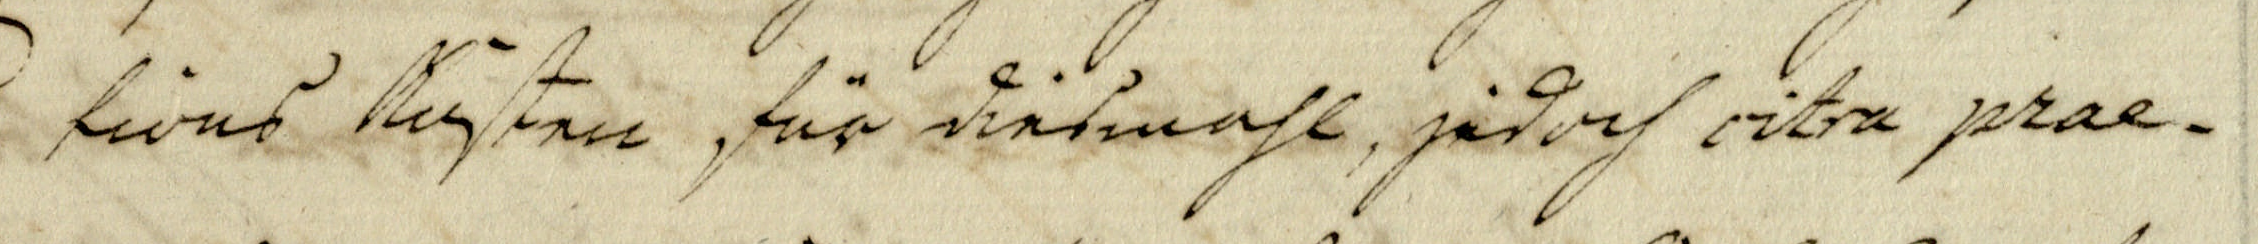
tions Kosten für diesmahl, jedoch citra prae-
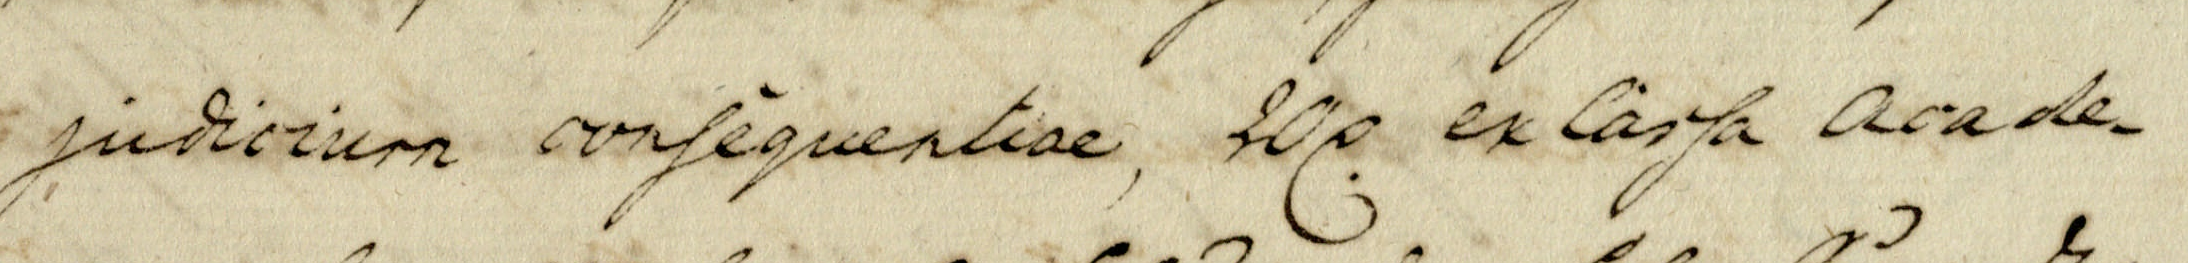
judicium consequentiae, 20 l. ex Cassa Acade¬
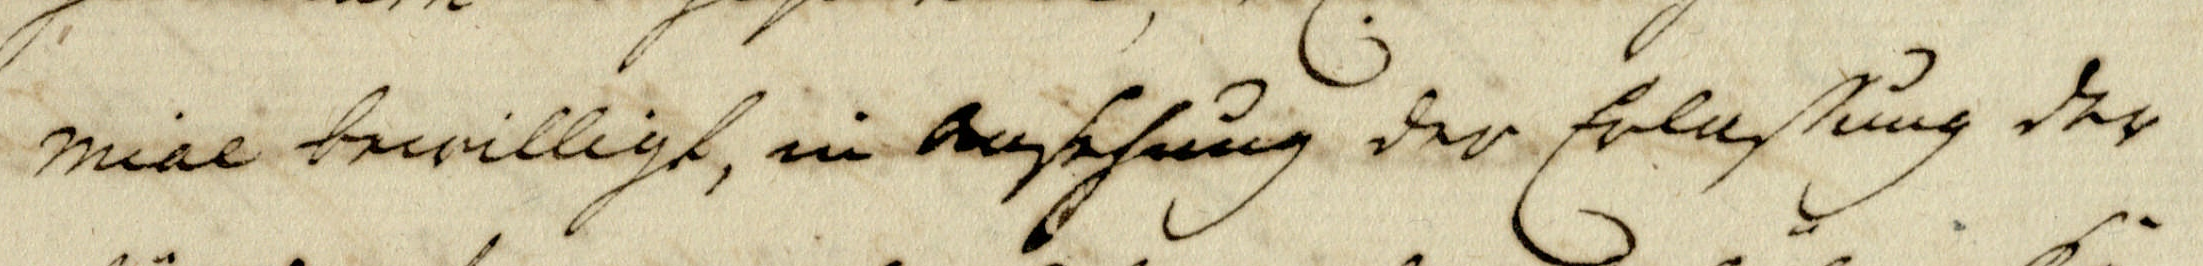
miae bewilligt, in Ansehung der Erlassung der
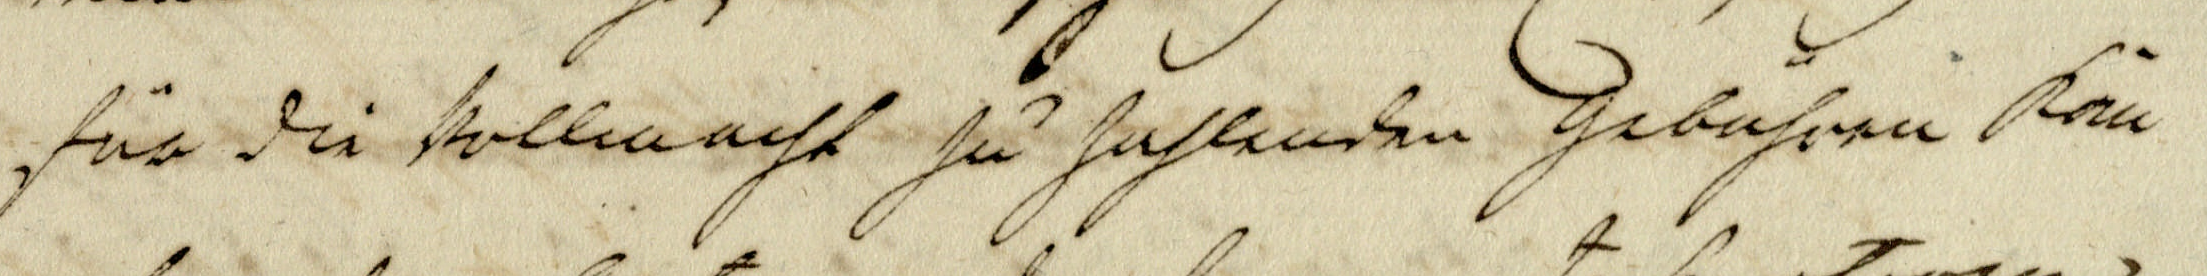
für die Vollmacht zu zahlenden Gebühren kan
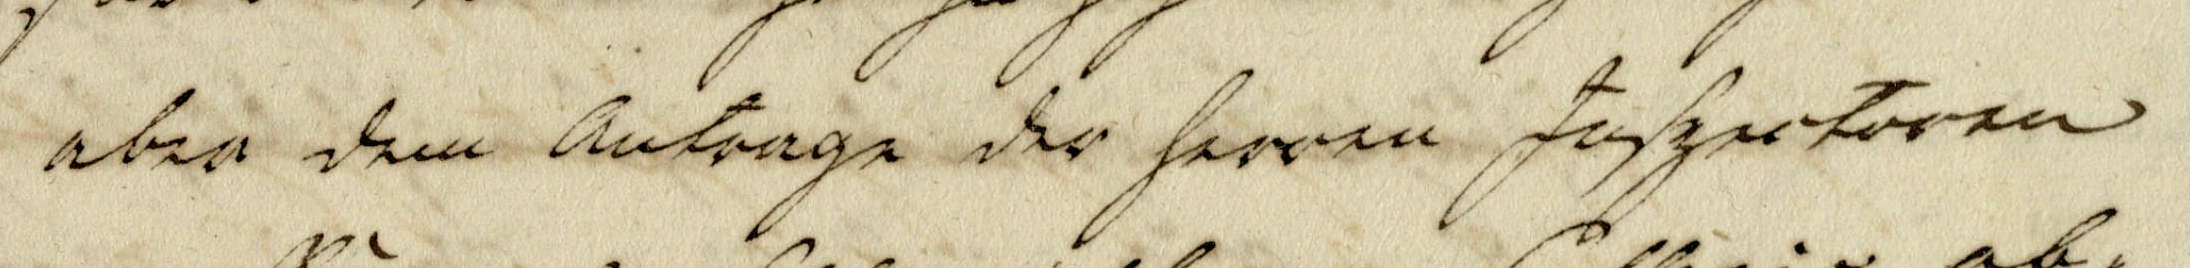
aber dem Antrage der Herren Inspectoren
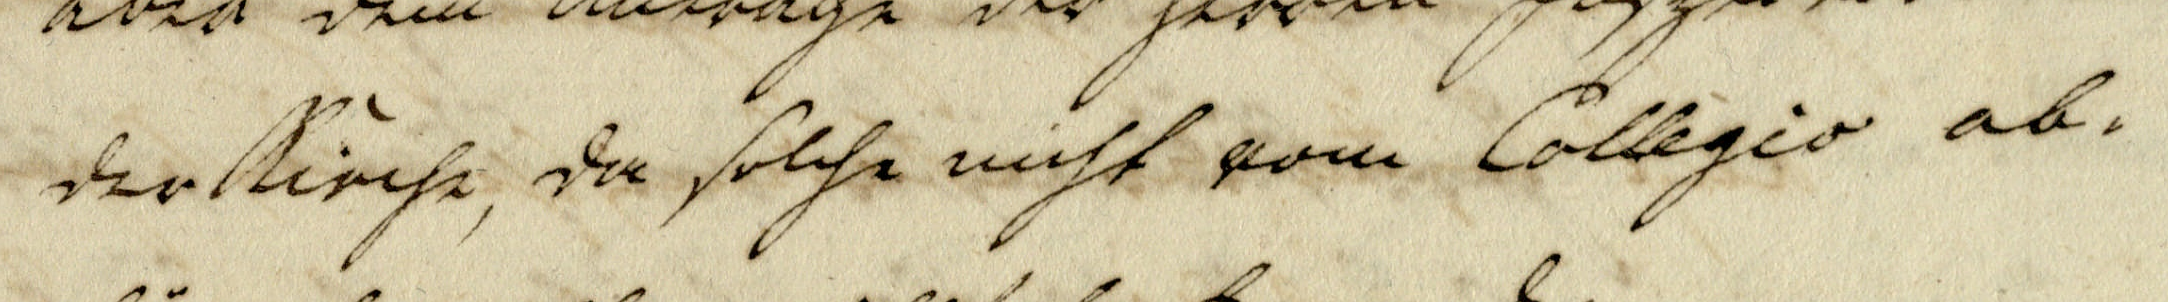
der Kirche, da solche nicht vom Collegio ab¬
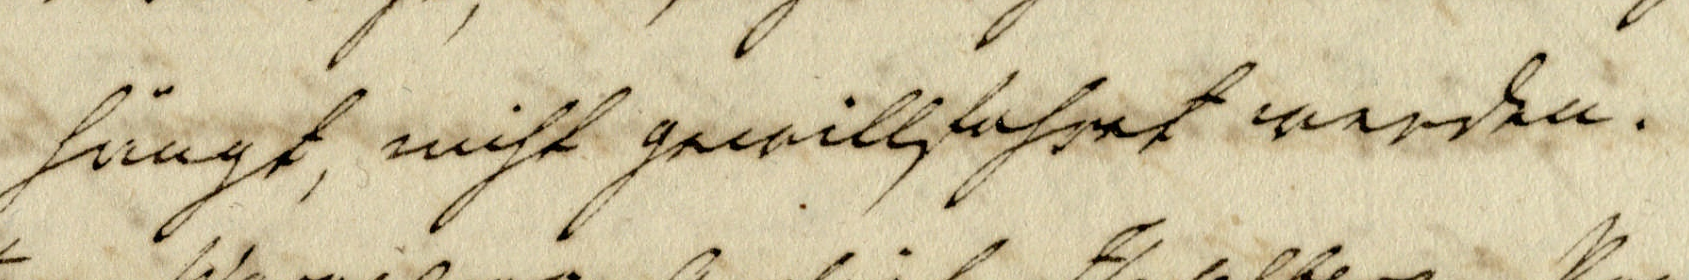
hängt, nicht gewillfahret werden.
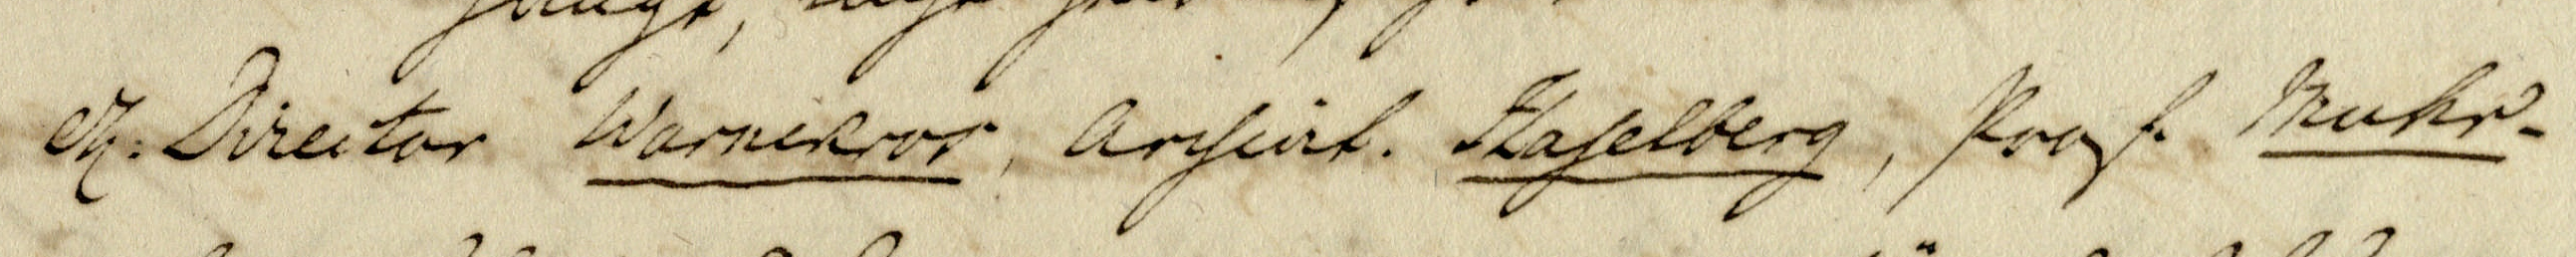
dh. Director Warnekros, Archiat. Haselberg, Prof. Muhr¬
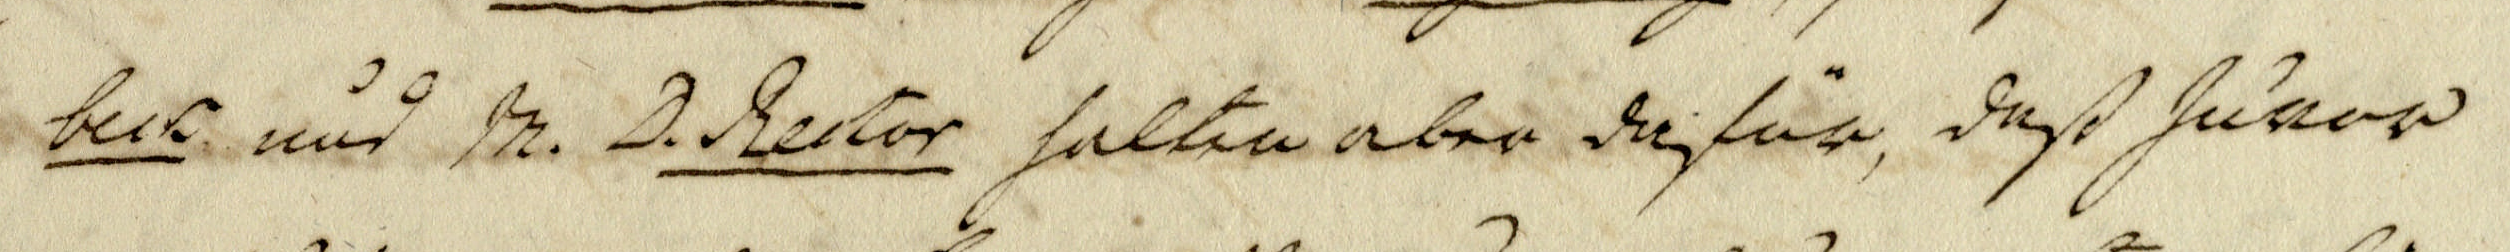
beck und M. D. Rector halten aber dafür, daß zuvor
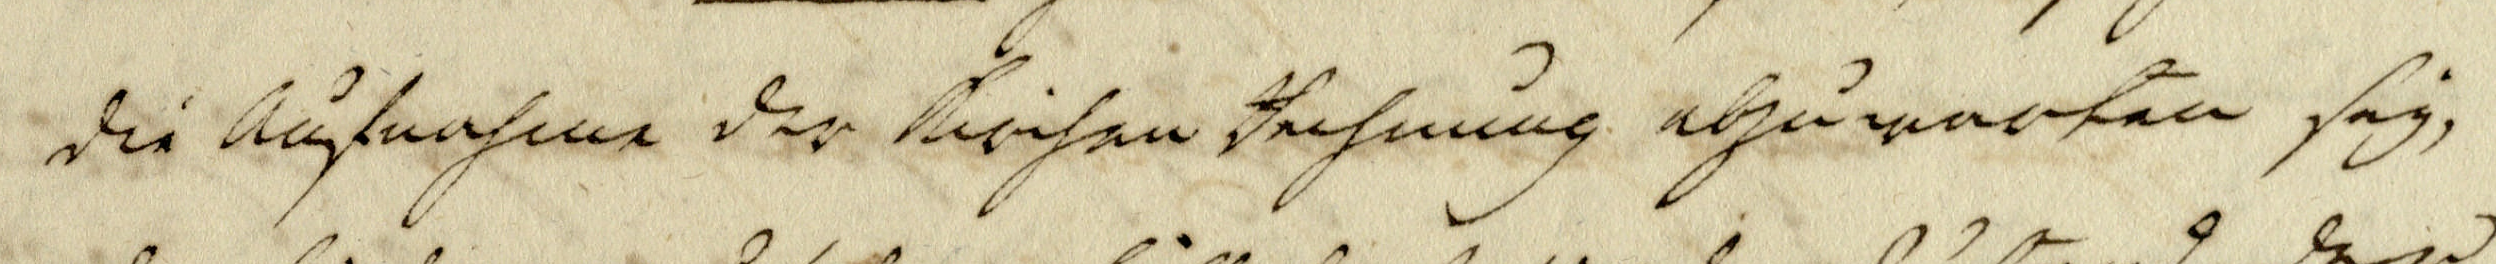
die Aufnahme der Kirchen Rechnung abzuwarten seÿ,
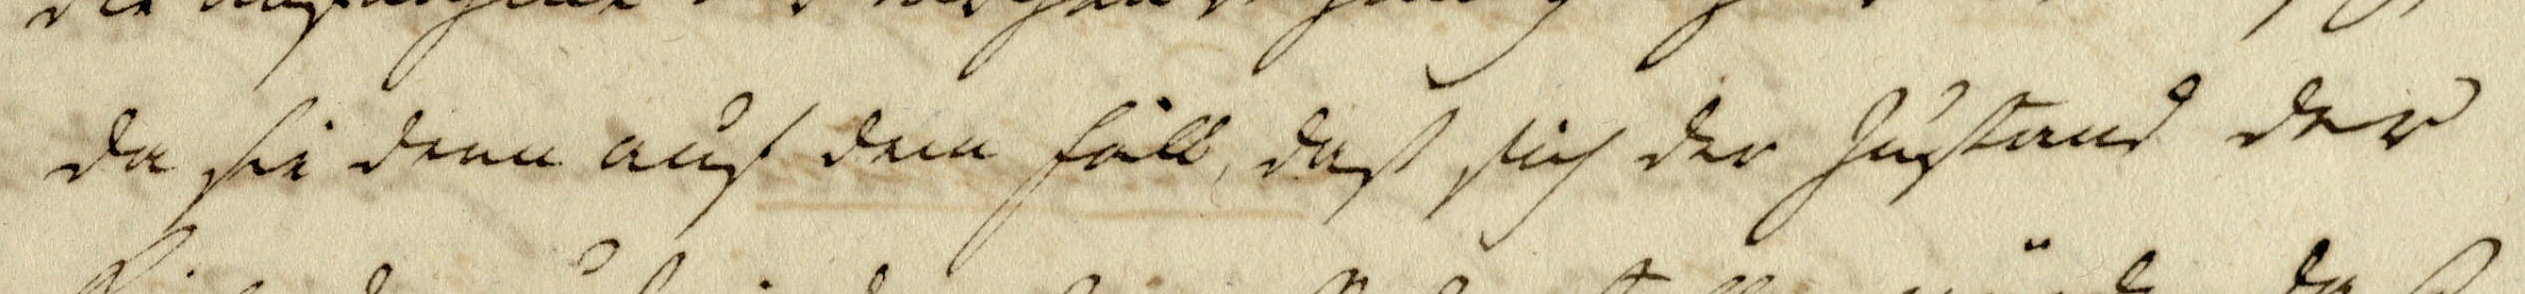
da sie denn auf dem Fall, daß sich der Zustand der
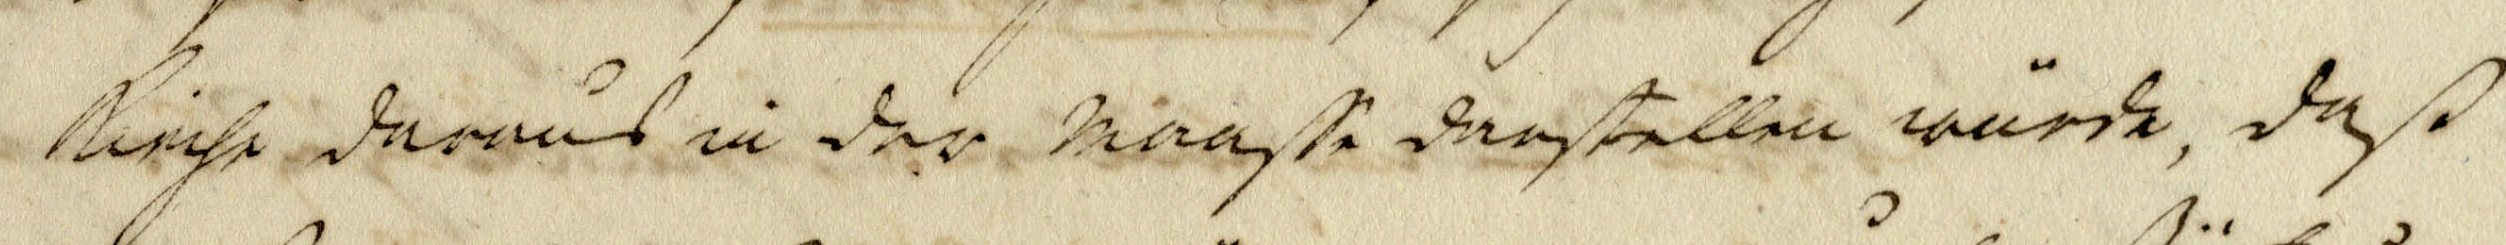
Kirche daraus in der Maasse darstellen würde, daß
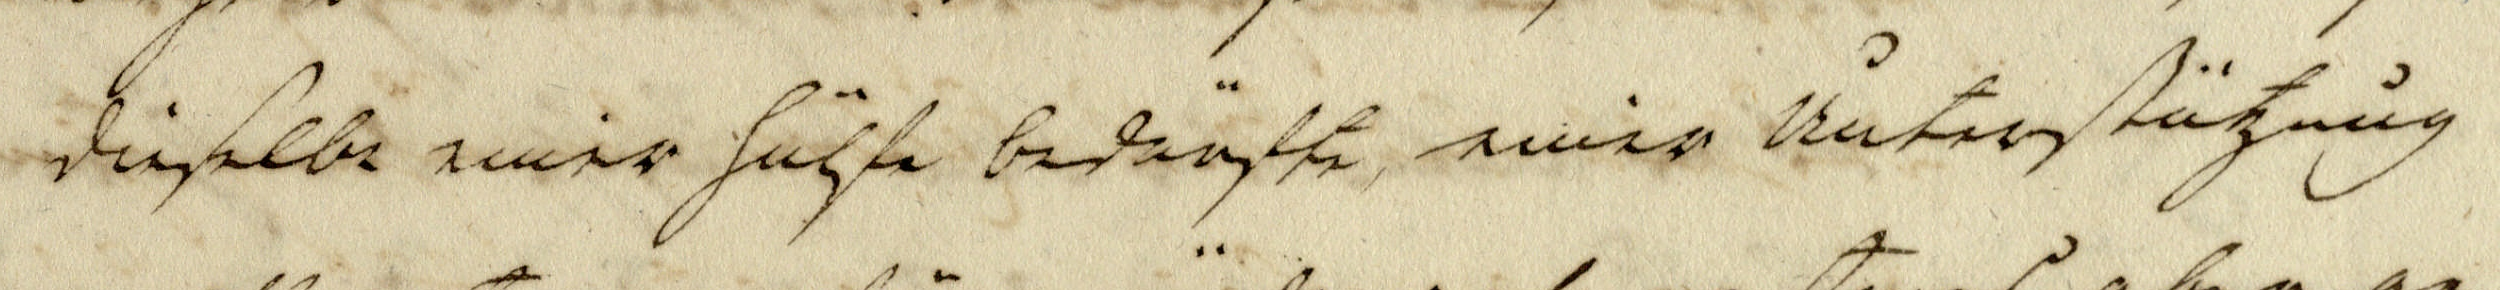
dieselbe einer Hülfe bedürfte, einer Unterstützung
